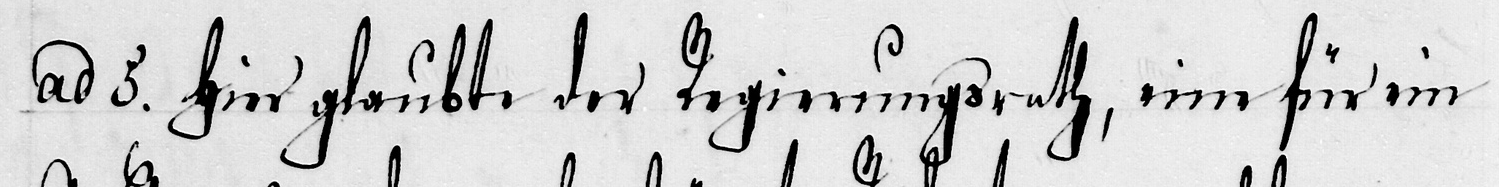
ad 5. Hier glaubte der Regierungsrath, eine für ein
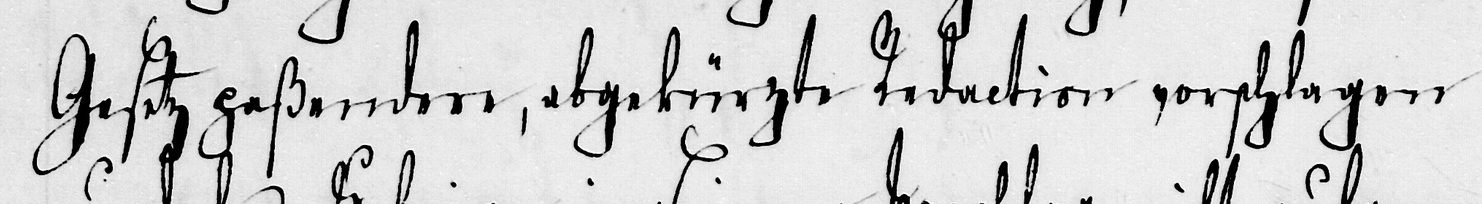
Gesetz paßendere, abgekürzte Reduction vorschlagen
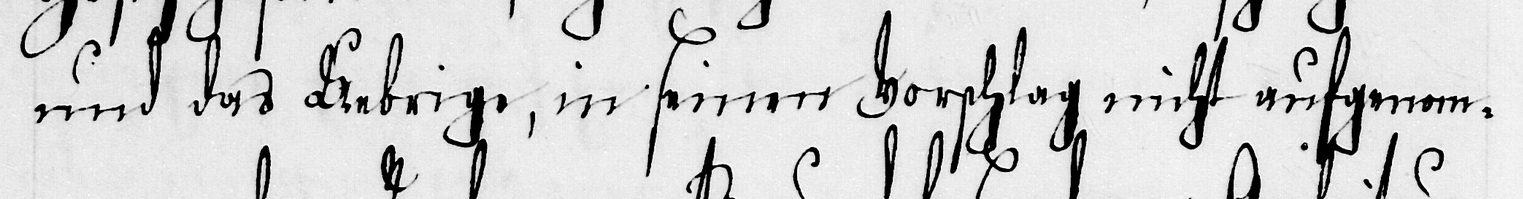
und das Uebrige, in seinen Vorschlag nicht aufgenom¬
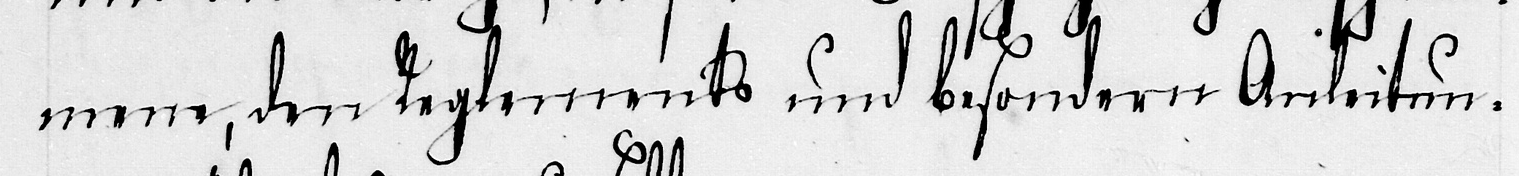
mene, den Reglements und besondern Anleitun¬
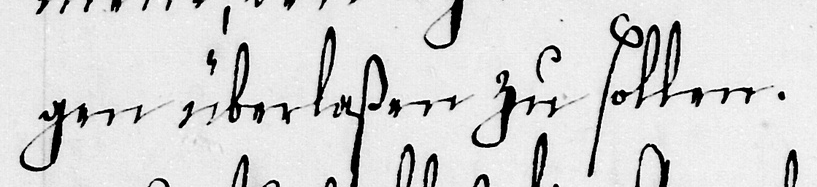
gen überlaßen zu sollen.
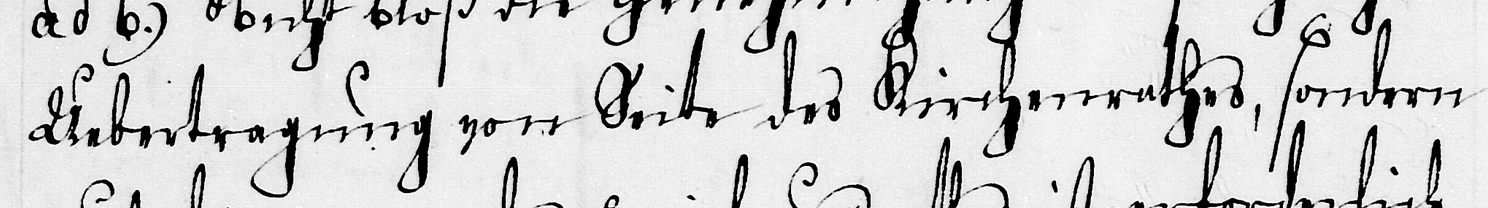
Uebertragung von Seite des Kirchenrathes, sondern
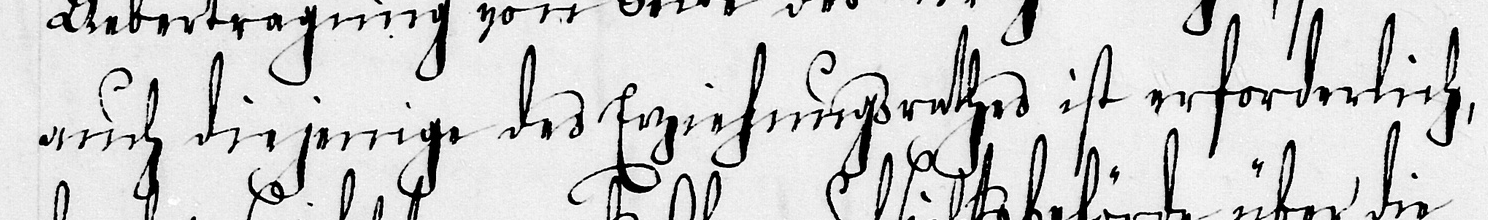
auch diejenige des Erziehungsrathes ist erforderlich,
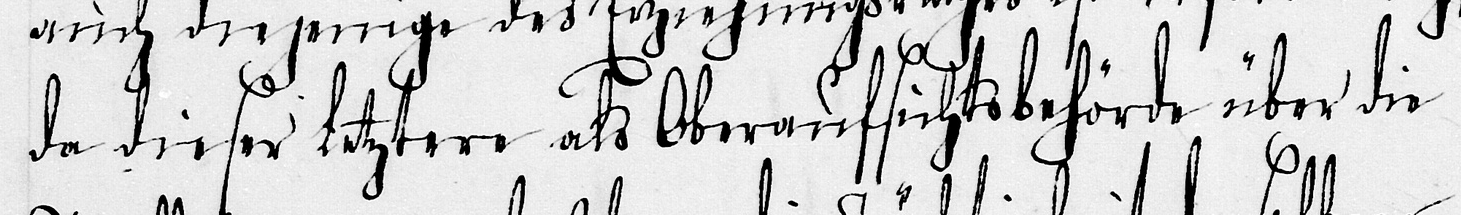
da dieser Letztere als Oberaufsichtsbehörde über die
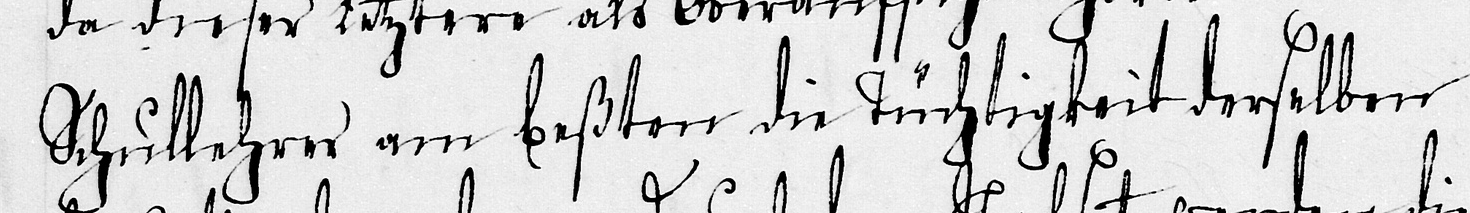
Schullehrer am beßten die Tüchtigkeit derselben
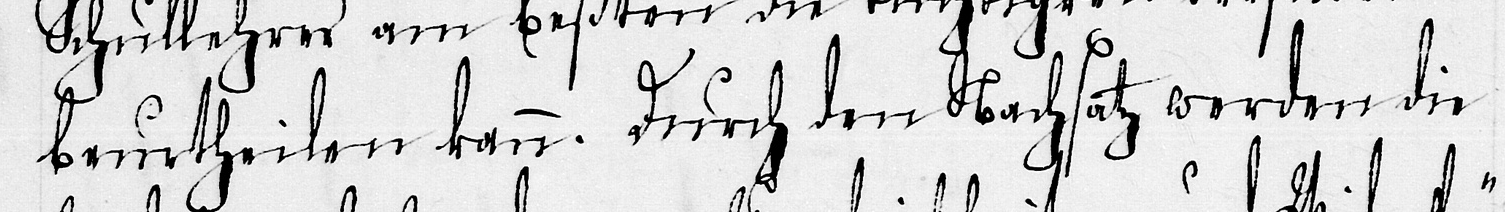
beurtheilen kann. Durch den Nachsatz werden die
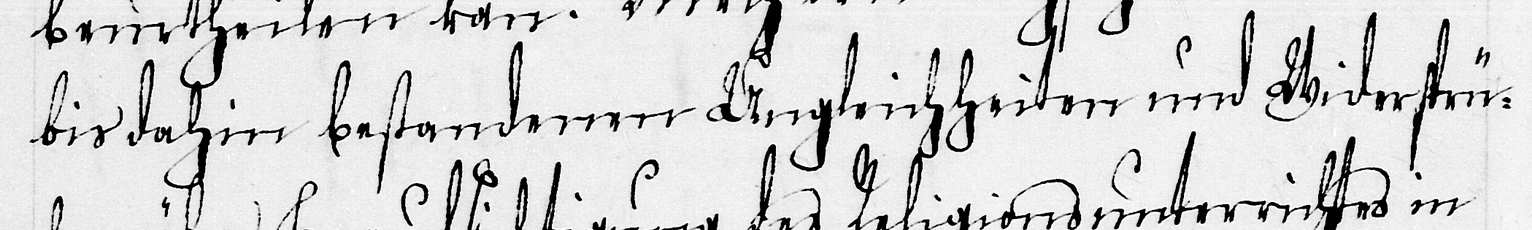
bis dahin bestandenen Ungleichheiten und Widersprü¬
